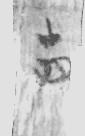{十四}
